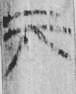亓
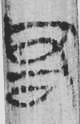○（始）
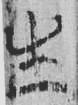生
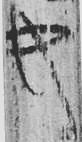女（如）
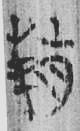薛（櫱）
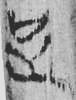足
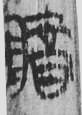𨟻（將）
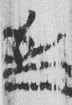至
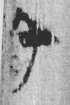千
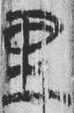里
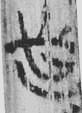必
